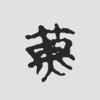黃
